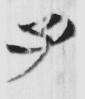子
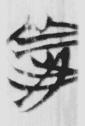義
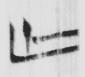亡
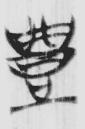豊
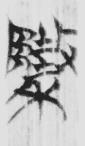{阜圭攴禾}
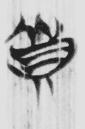貨
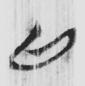㠯（以）
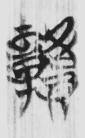贛
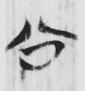公
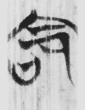命
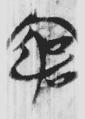竆
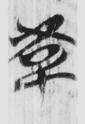韋
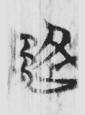陞
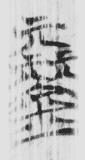{亓亓亓金}
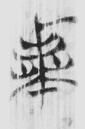奏
